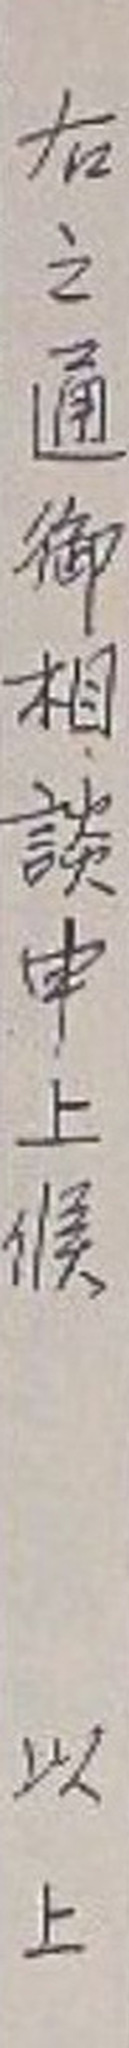右之通御相談申上候以上
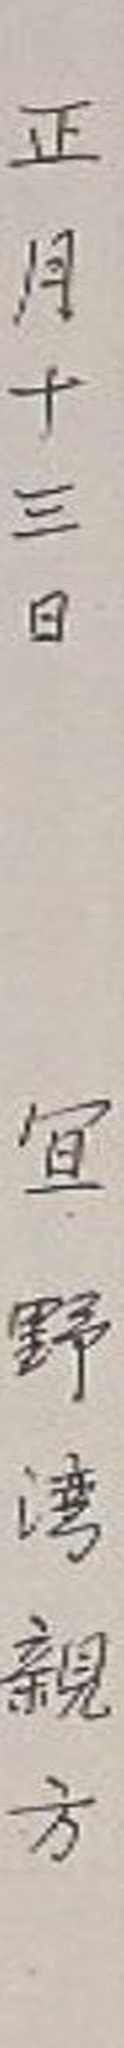正月十三日宜野湾親方
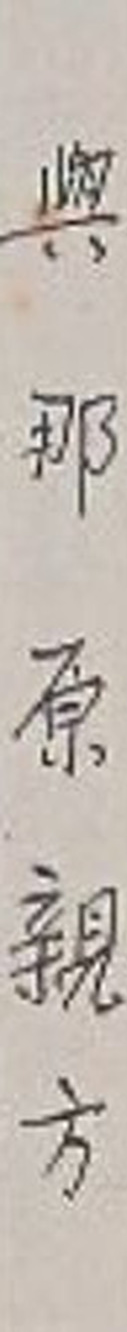与那原親方
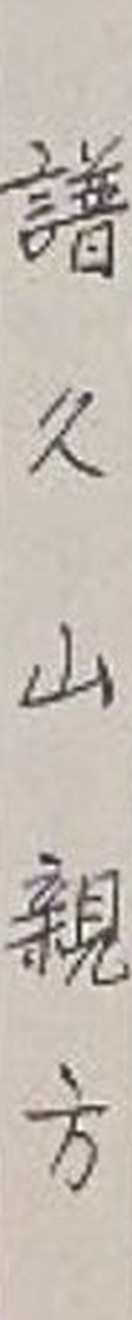譜久山親方
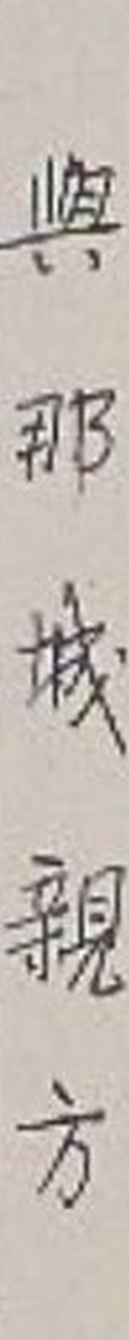与那城親方
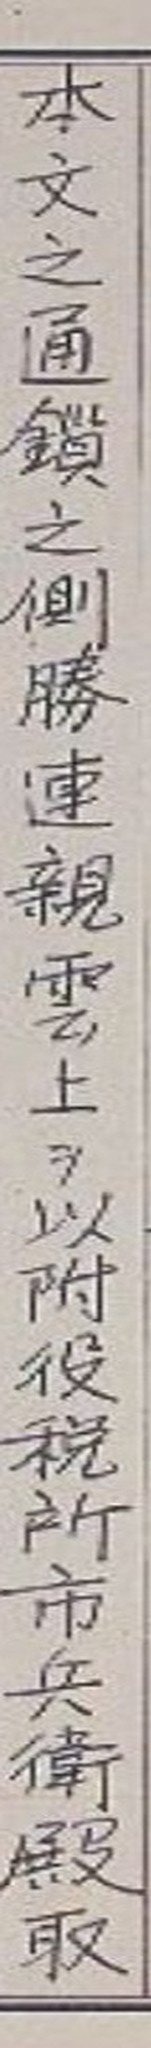本文之通鎖之側勝連親雲上を以附役税所市兵衛殿取
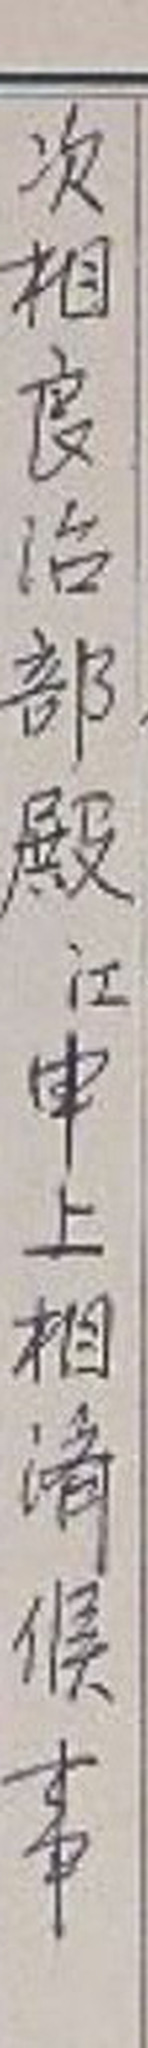次相良治部殿え申上相済候事
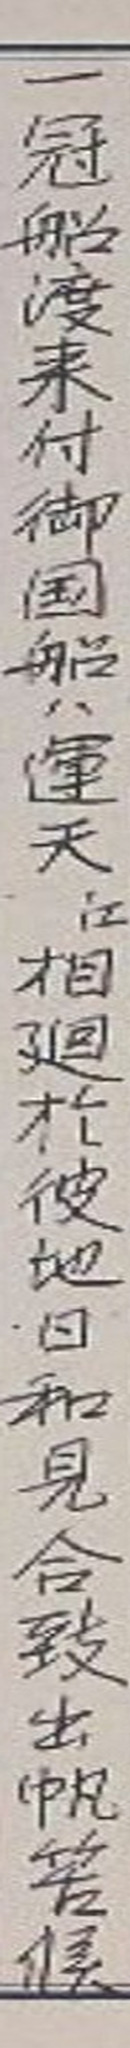一冠船渡来付御国船は運天え相廻於彼地日和見合致出帆筈候
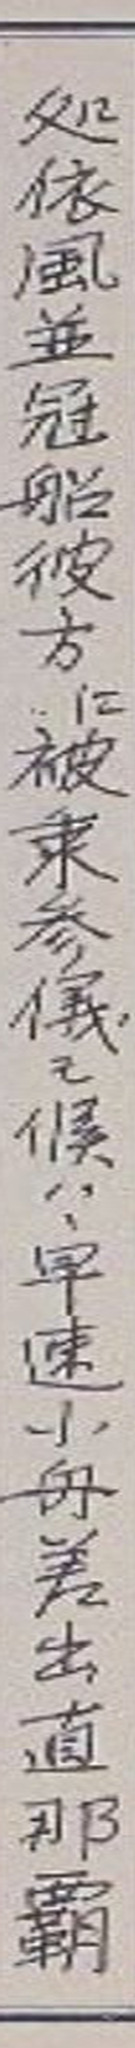処依風並冠船彼方え被乗参儀も候はゝ早速小舟差出直那覇
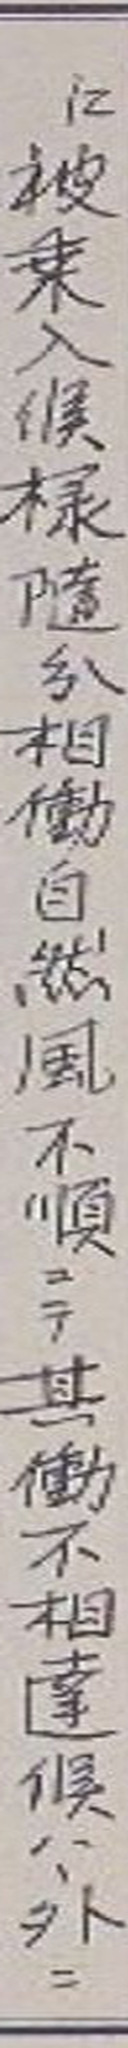え被乗入候様随分相働自然風不順にて其働不相達候はゝ外に
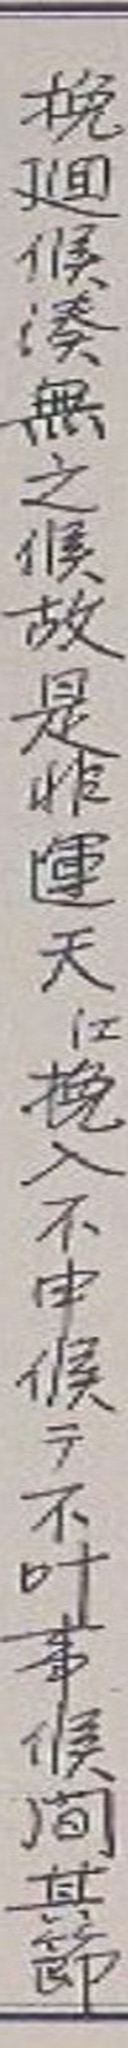挽廻候湊無之候故是非運天え挽入不申候て不叶事候間其節
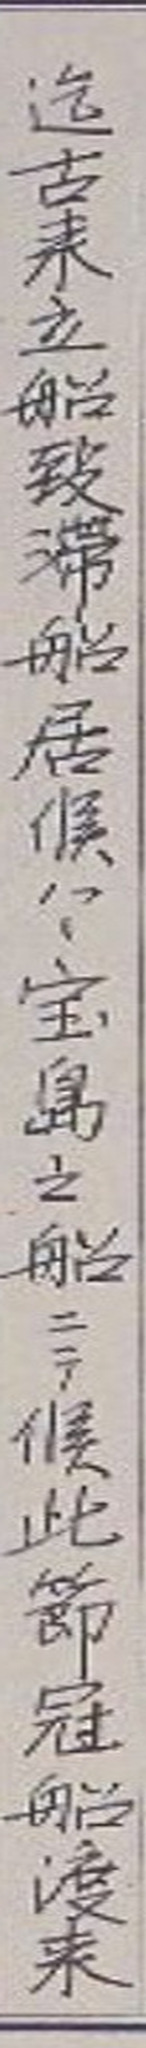迄古来立船致滞船居候はゝ宝島之船にて候此節冠船渡来
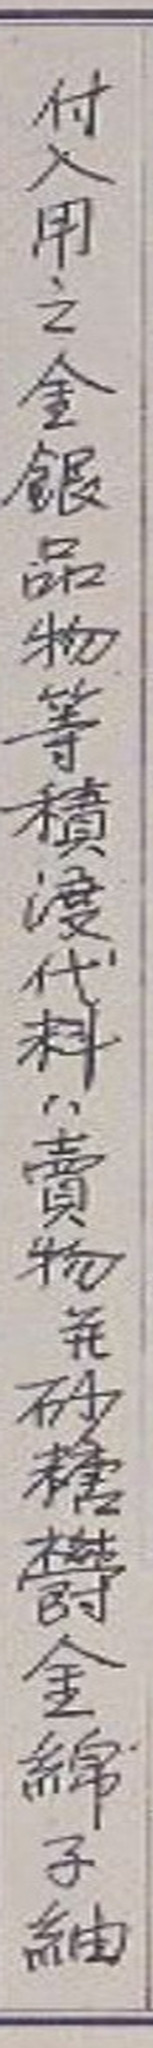付入用之金銀品物等積渡代料は売物并砂糖欝金綿子紬
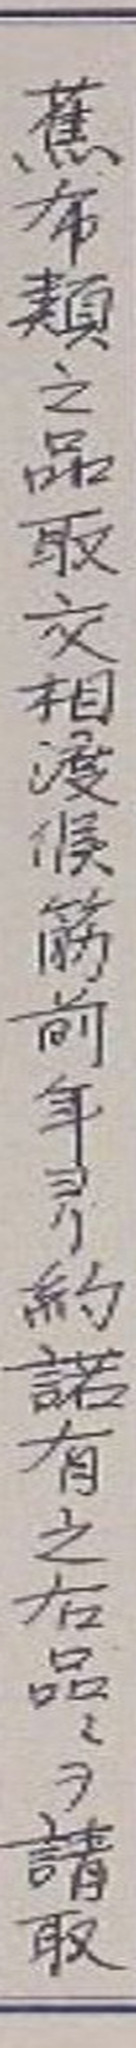蕉布類之品取交相渡候節前年より約諾有之右品々を請取

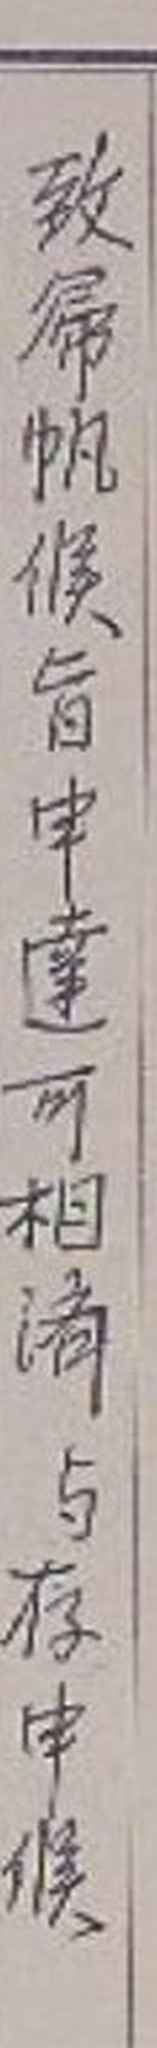致帰帆候旨申達可相済と存申候
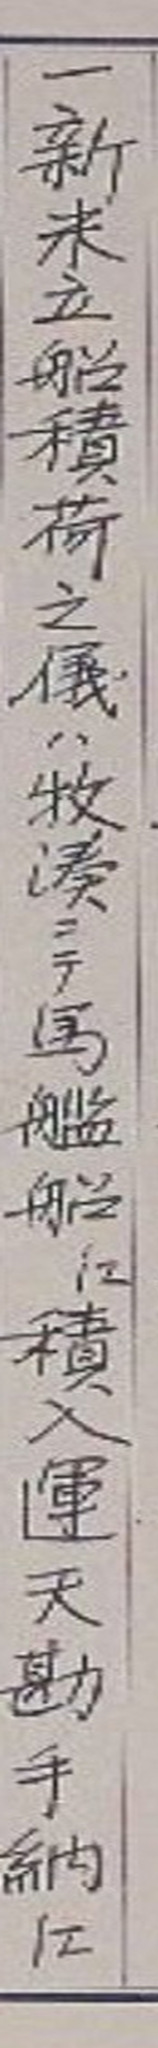一新米立船積荷之儀は牧湊にて馬艦船え積入運天勘手納え
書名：支那冊封使来琉諸記 下巻
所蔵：University of the Ryukyus Library
